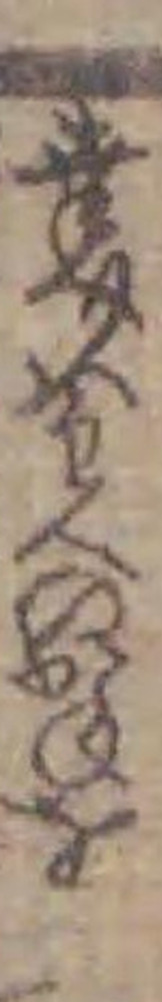幸介は主人のかねを
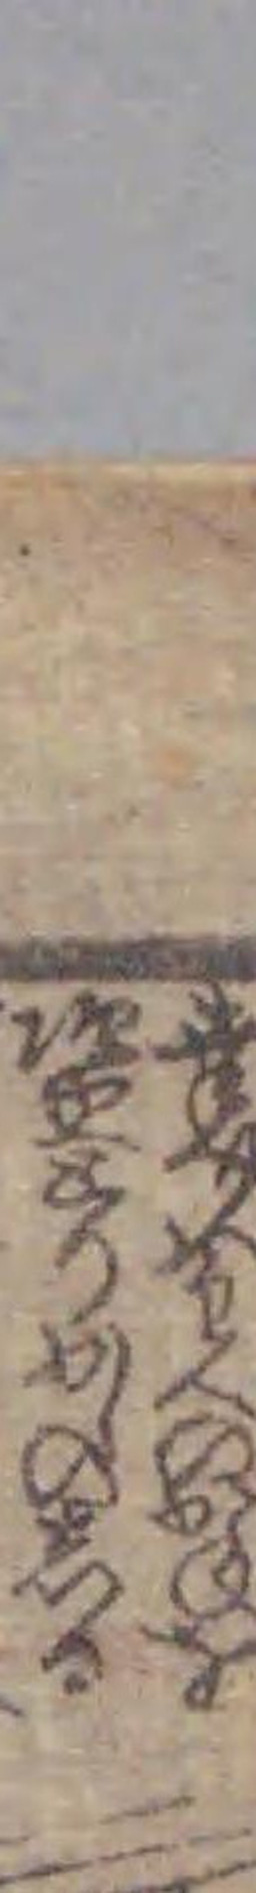盗とり少しのしる
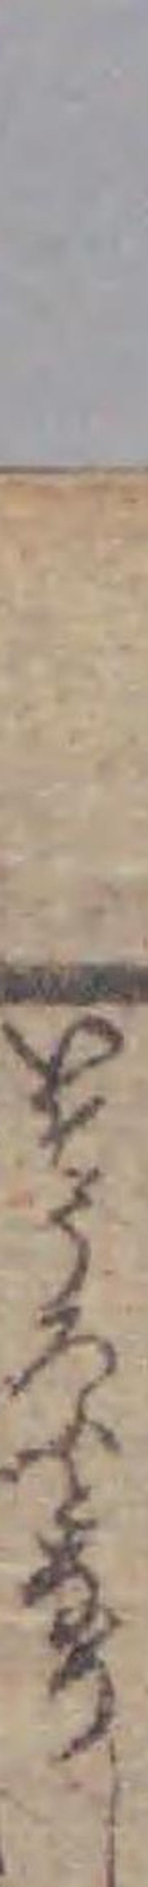いそうろふとなり
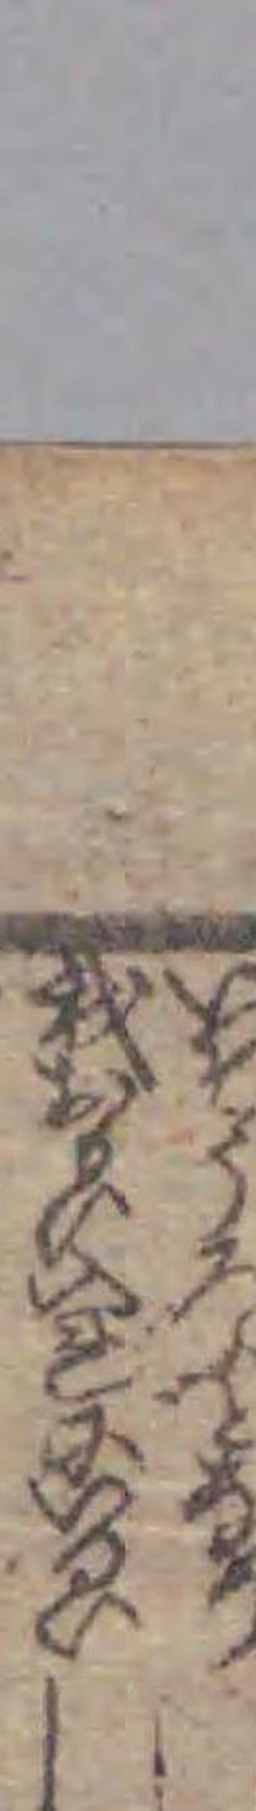我おもい入れにいるい
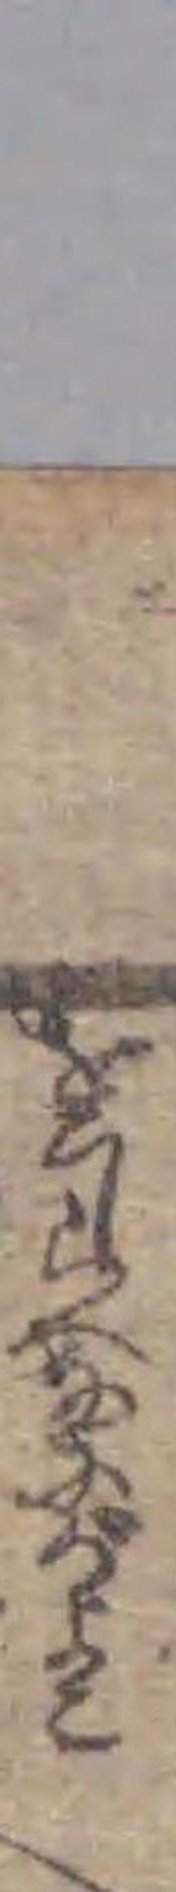をこしらへなにがよこ
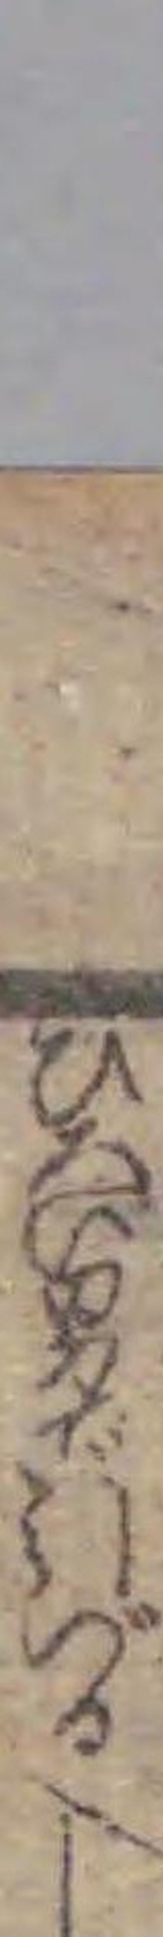ひろい男で引づる
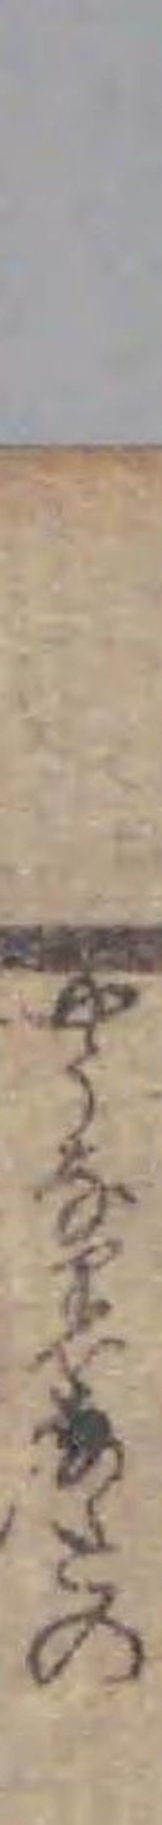やうな黒なゝこの
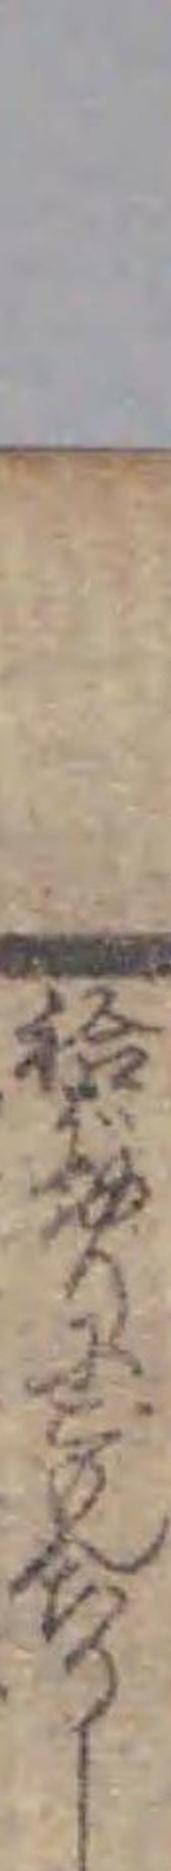袷ばおりにこもんちり
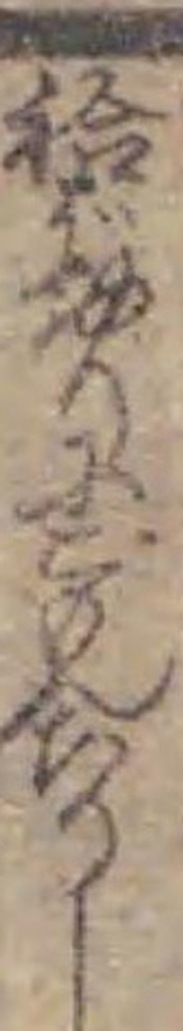袷ばおりにこもんちり
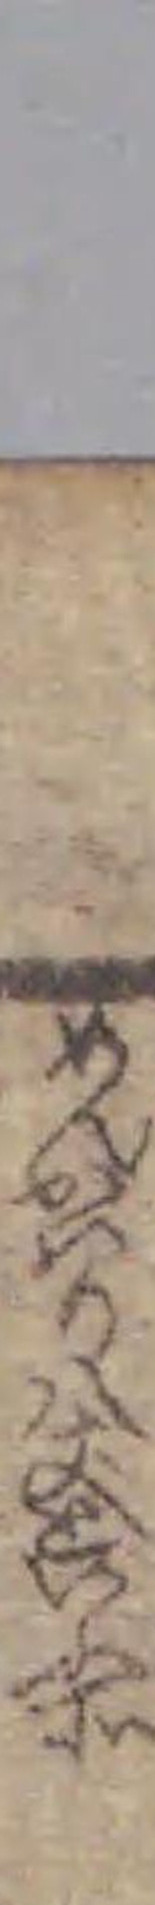めんかはり八丈といふ所
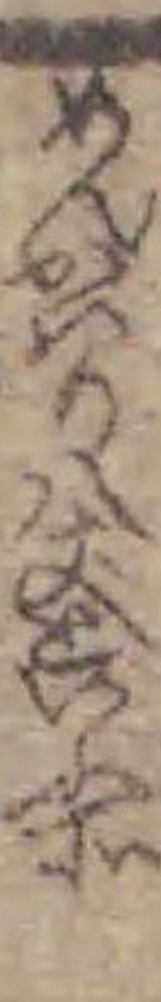めんかはり八丈といふ所
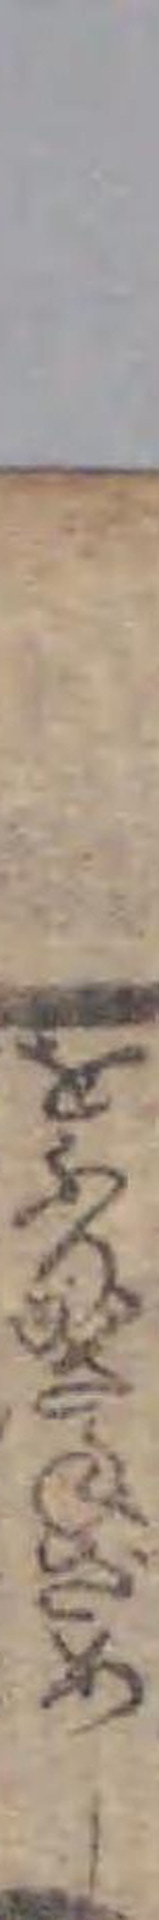をふりかさねさめ
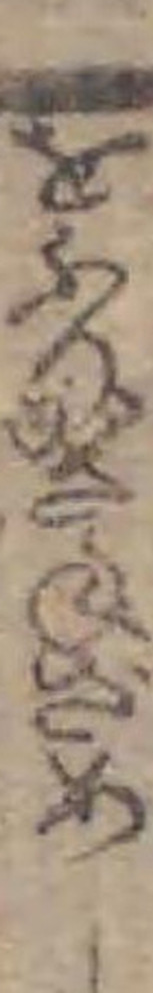をふりかさねさめ
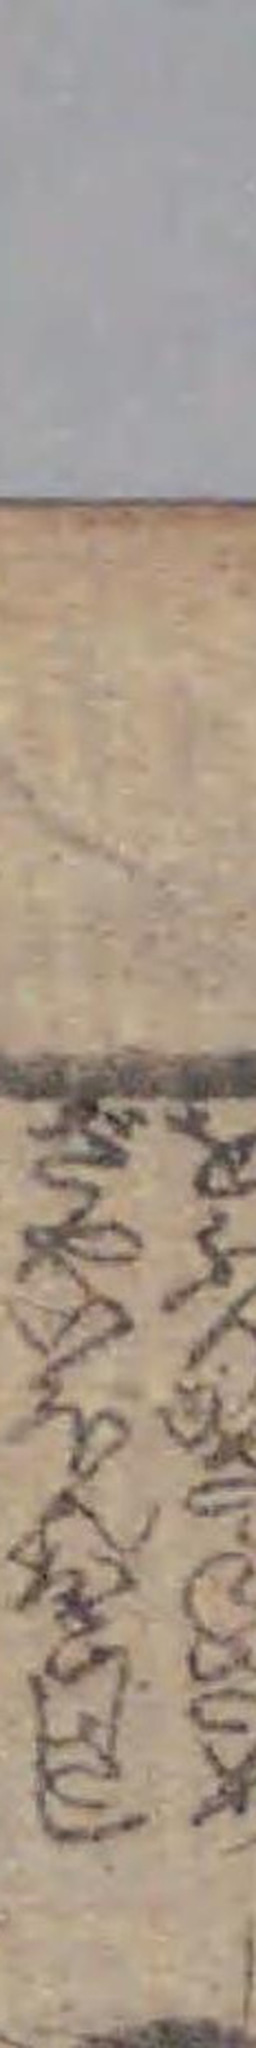ざやいほんおとしざし
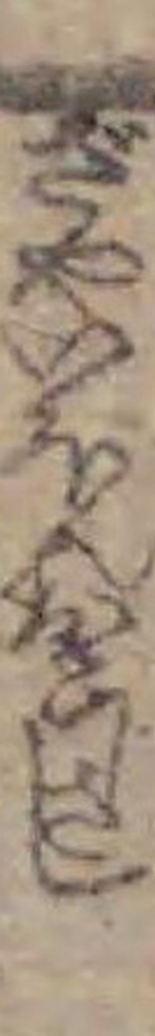ざやいほんおとしざし
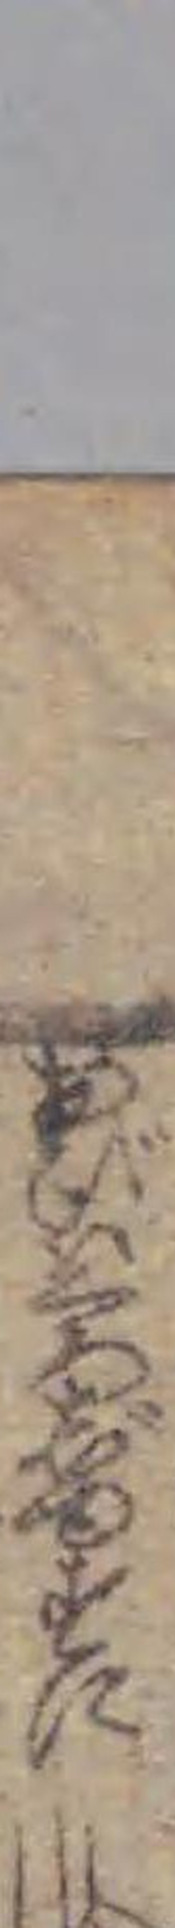おびはくろじゅすに
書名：通風伊勢物語 : 3巻
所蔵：国立国会図書館 National Diet Library, JAPAN
